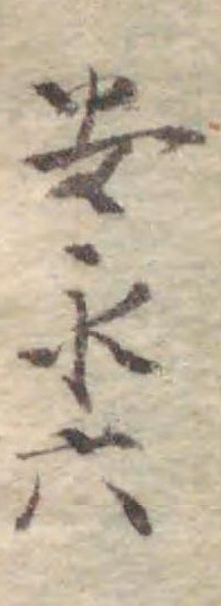安永六
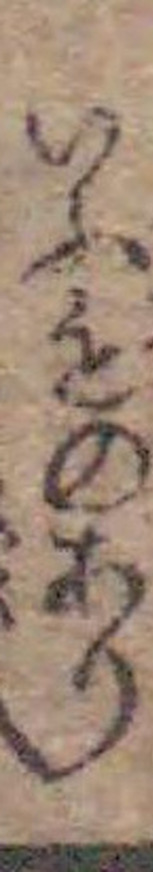いふものあり
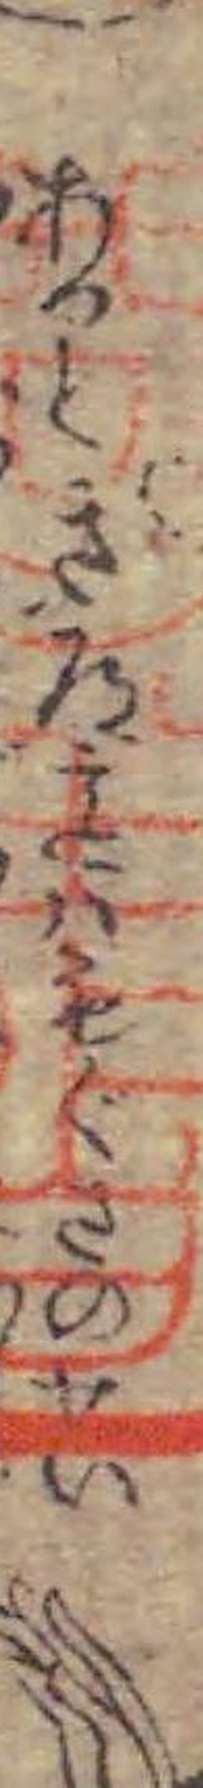あるとき道意はもぐさのせい
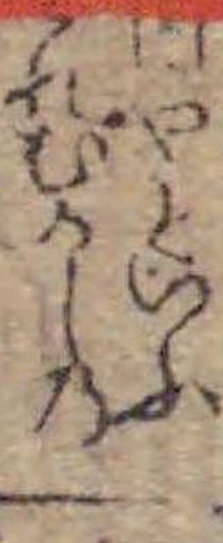むかし近
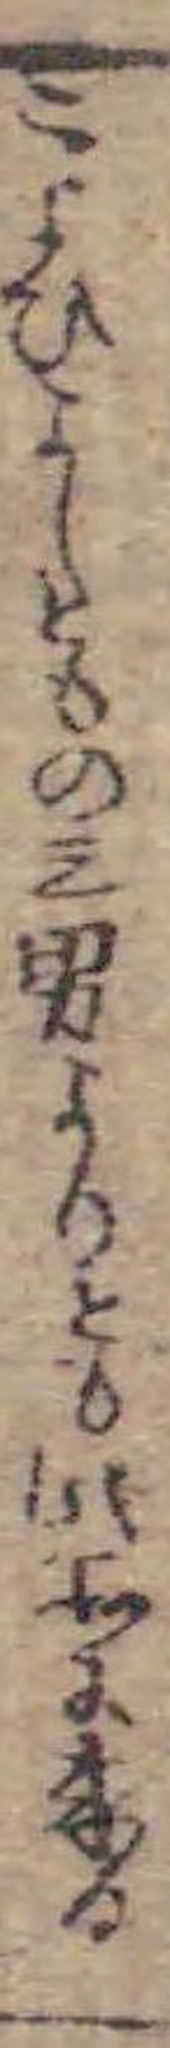こよひよしともの三男よりとも此所に来る
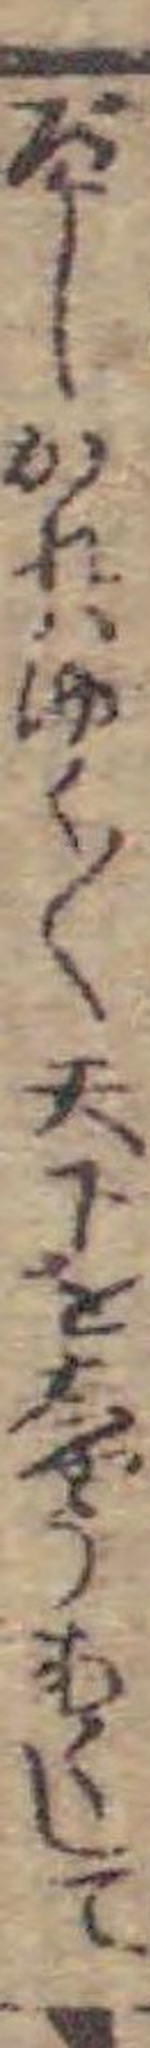べしかれはゆく〳〵天下をしやうあくして
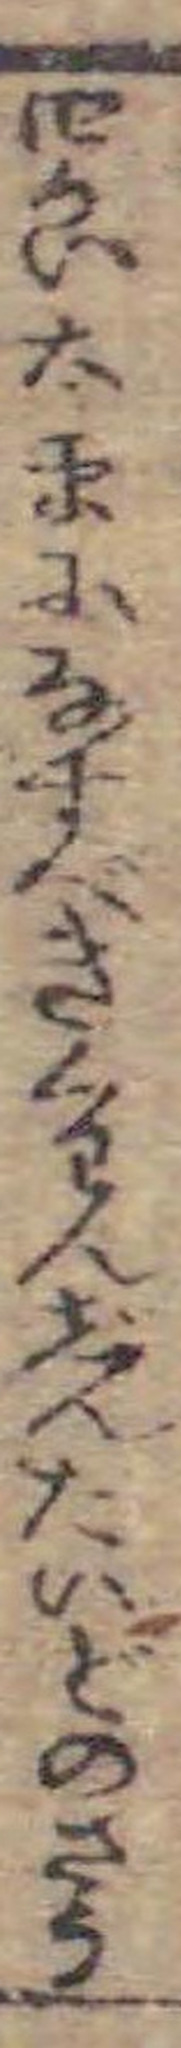四かい太平になすべきくわんじんたいどのさう
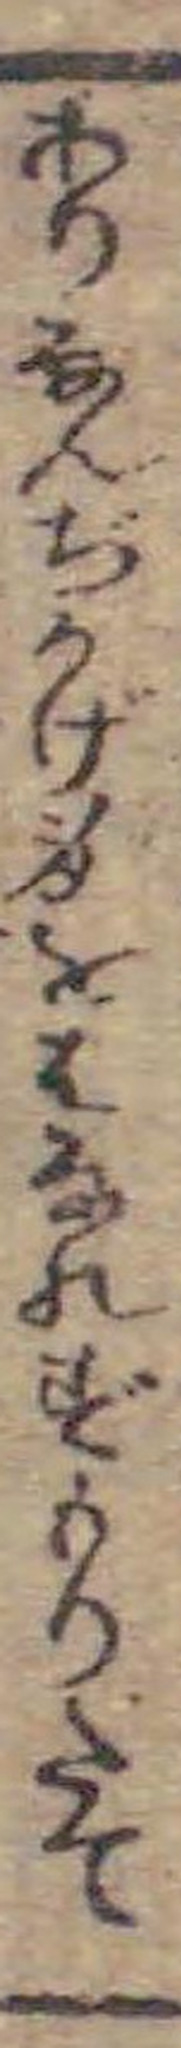ありなんぢかげ身をはなれずもりたて
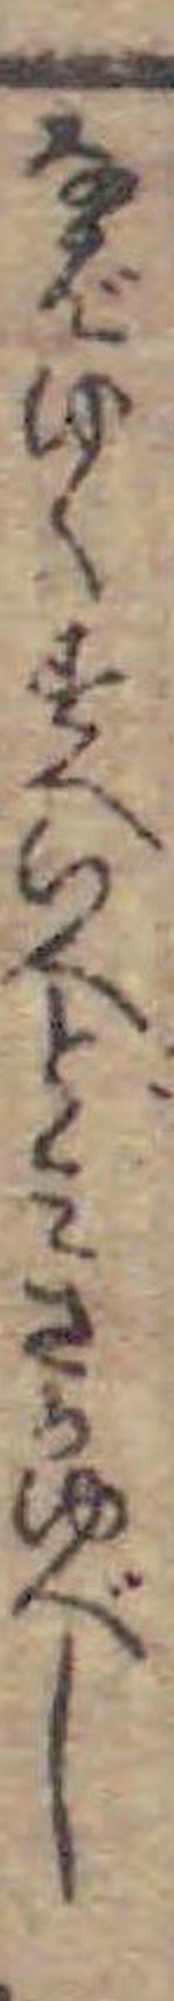なばゆくすへいへとみさかゆべし
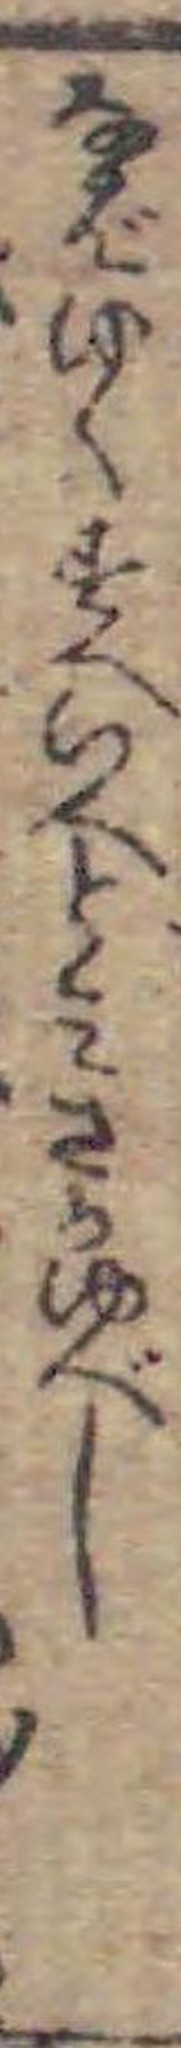なばゆくすへいへとみさかゆべし
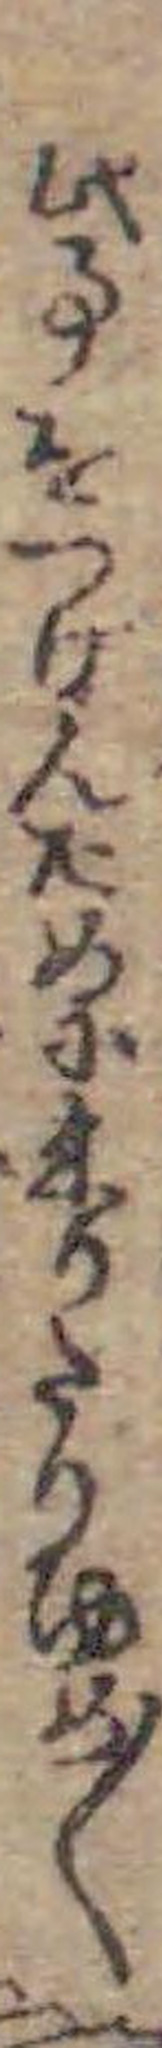此事をつげんために来りたりゆめ〳〵
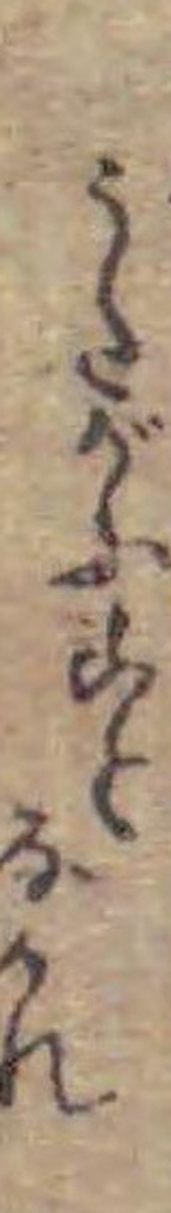うたがふことなかれ
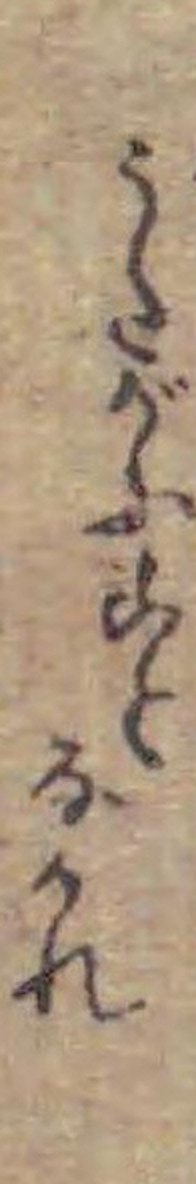うたがふことなかれ

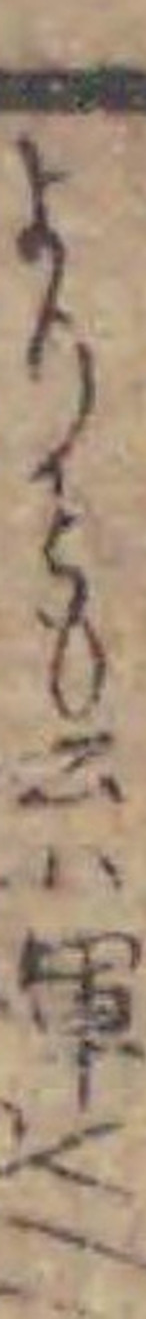よりとも公は軍
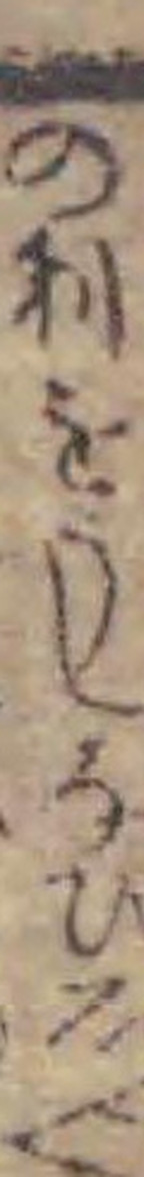の利をうしなひ石
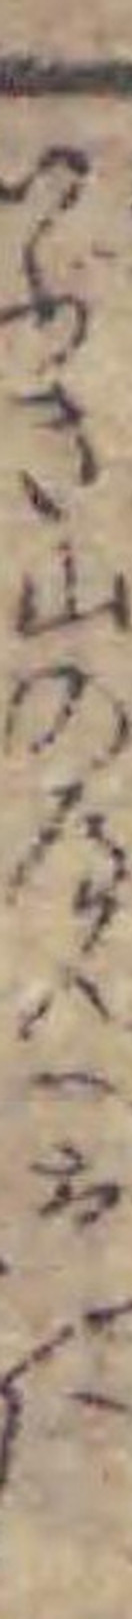いぶき山のへんへお
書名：三舛増鱗組 : 3巻
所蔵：国立国会図書館 National Diet Library, JAPAN
